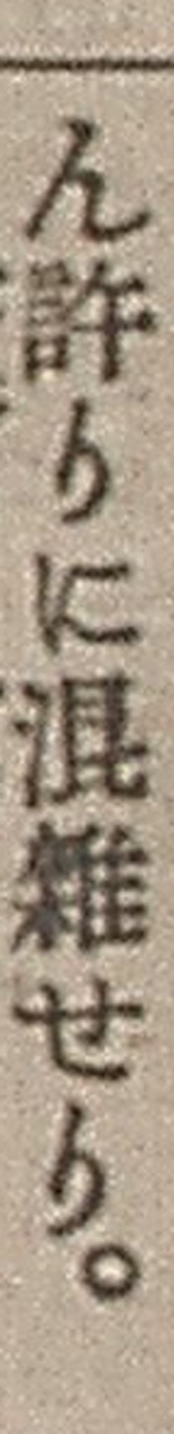ん許りに混雑せり。
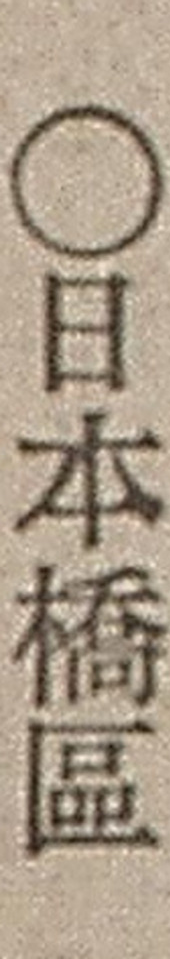〇日本橋区
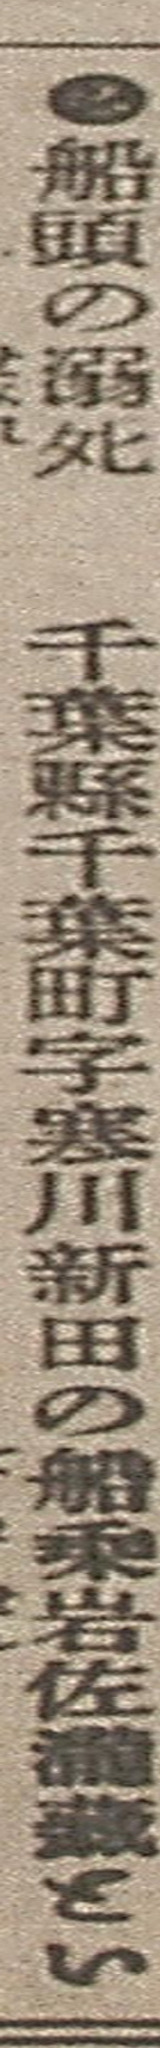●船頭の溺死千葉県千葉町字寒川新田の船乗岩佐瀧蔵とい
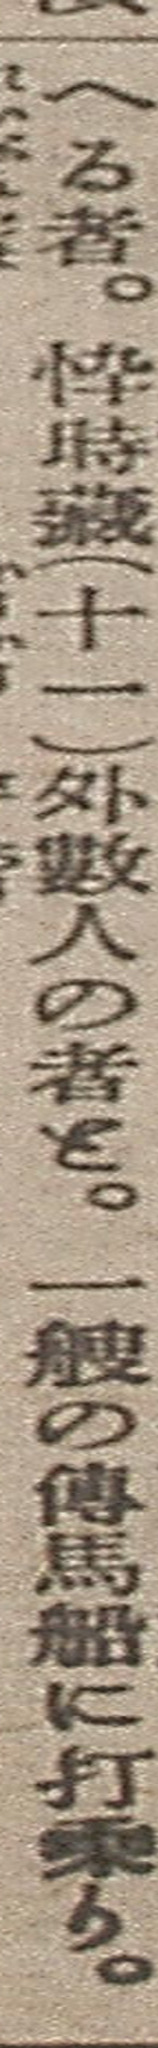へる者。忰時蔵外数人の者と。一艘の伝馬船に打乗り。
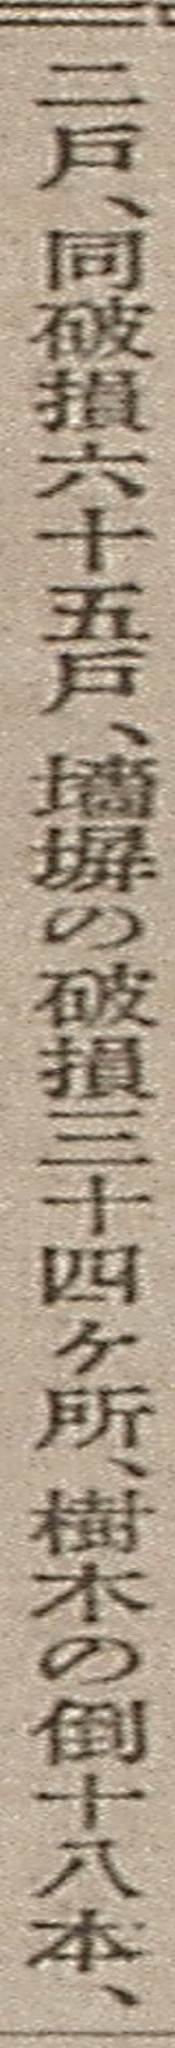二戸、同破損六十五戸、墻塀の破損三十四ケ所、樹木の倒十八本、
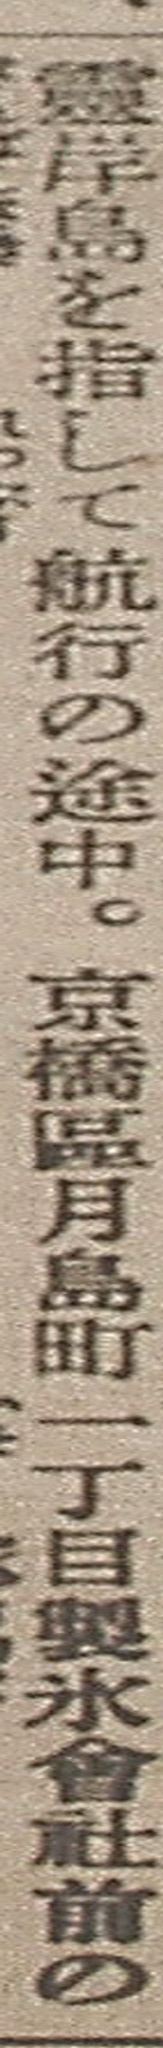霊岸島を指して航行の途中。京橋区月島町一丁目製氷会社前の
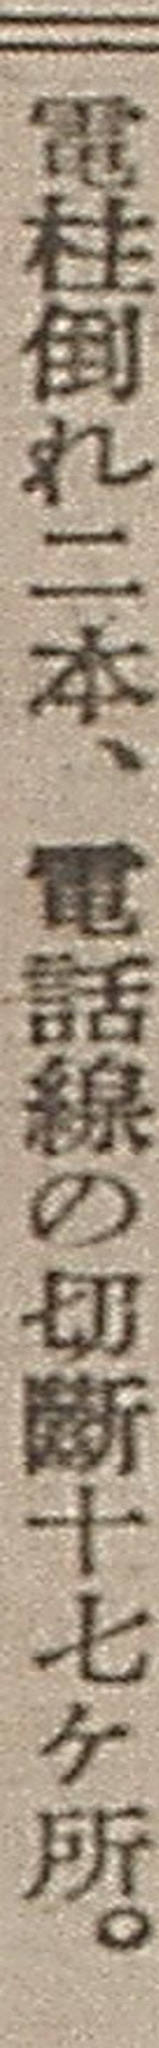電柱倒れ二本、電話線の切断十七ケ所。
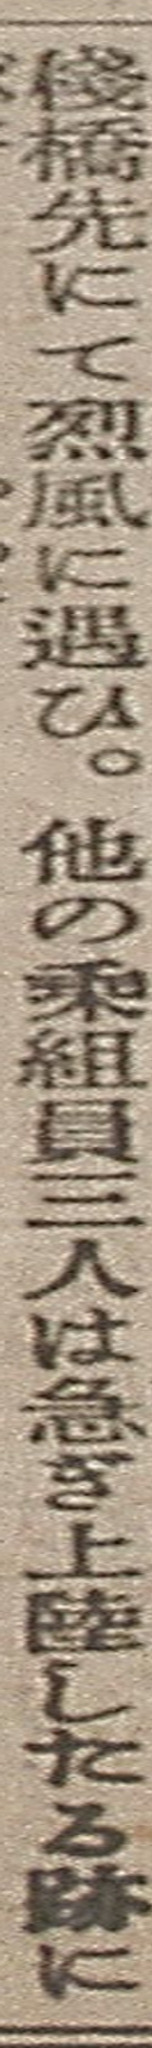桟橋先にて烈風に遇ひ。他の乗組員三人は急ぎ上陸したる跡に
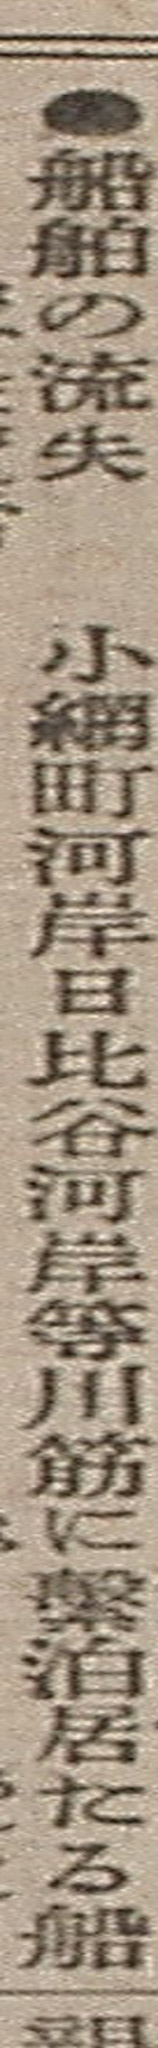●船舶の流失小網町河岸日比谷河岸等川筋に繋泊居たる船
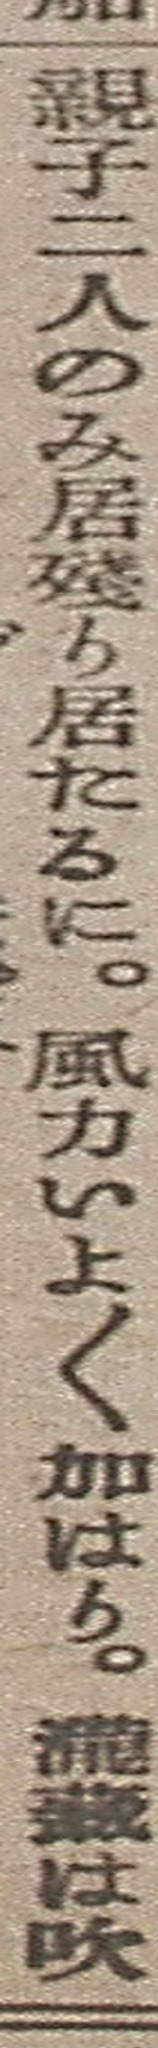親子二人のみ居残り居たるに。風力いよ〳〵加はり。瀧蔵は吹
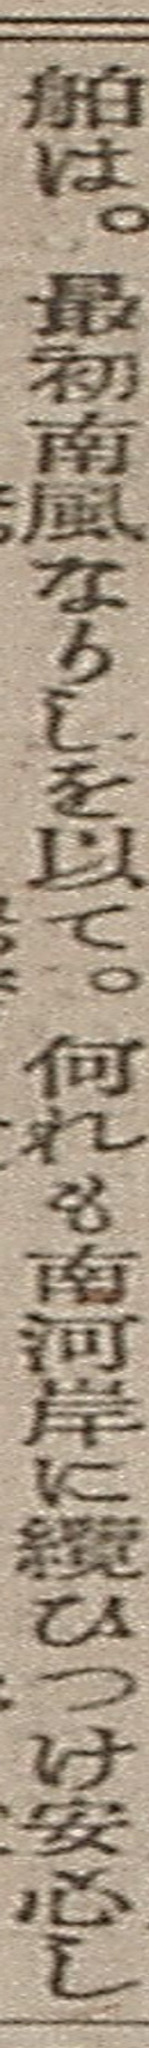舶は。最初南風なりしを以て。何れも南河岸に䌫もやひつけ安心し
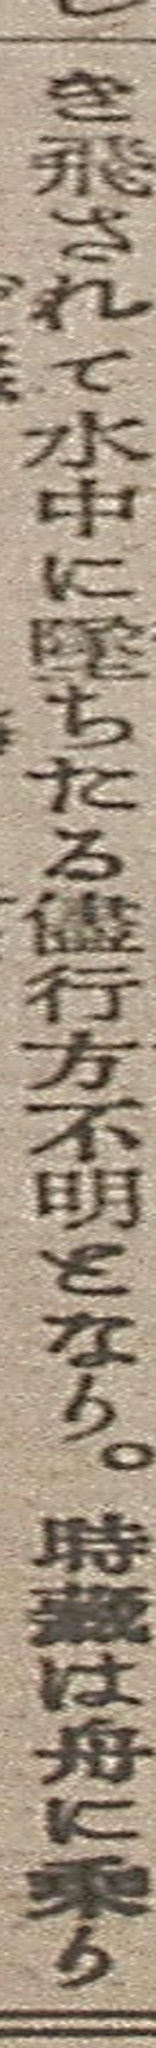き飛されて水中に堕ちたる侭行方不明となり。時蔵は舟に乗り
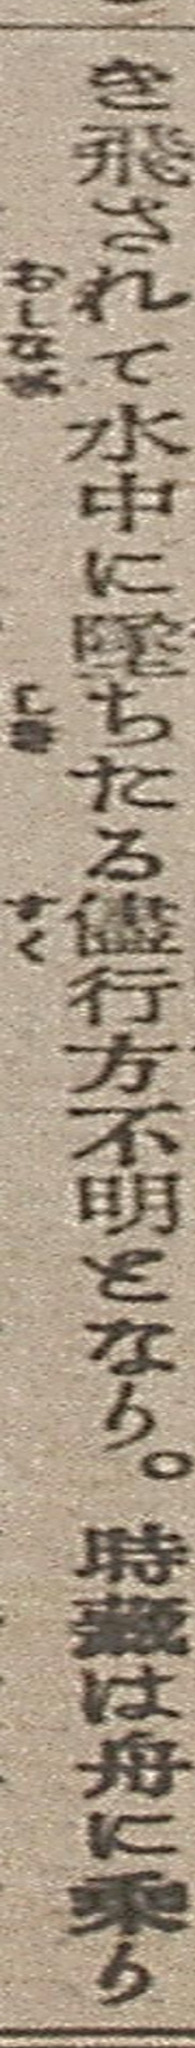き飛されて水中に堕ちたる侭行方不明となり。時蔵は舟に乗り
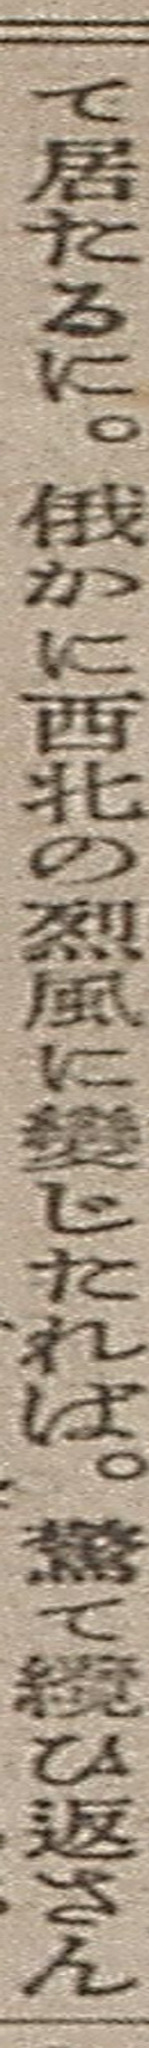て居たるに。俄かに西北の烈風に変じたれば。驚て䌫もやひ返さん
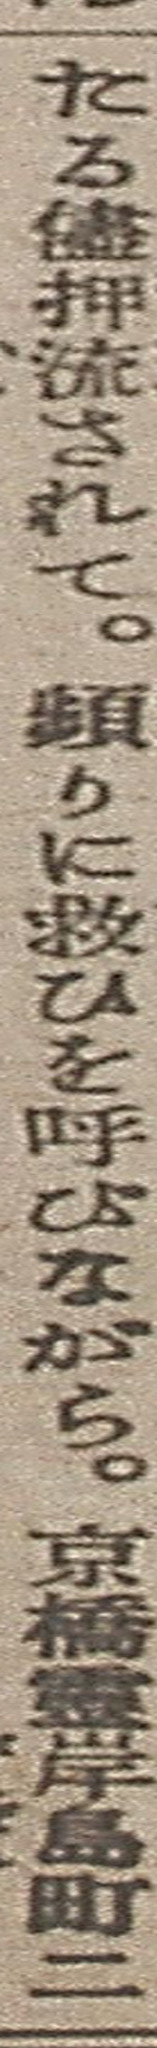たる侭押流されて。頻りに救ひを呼びながら。京橋霊岸島町二
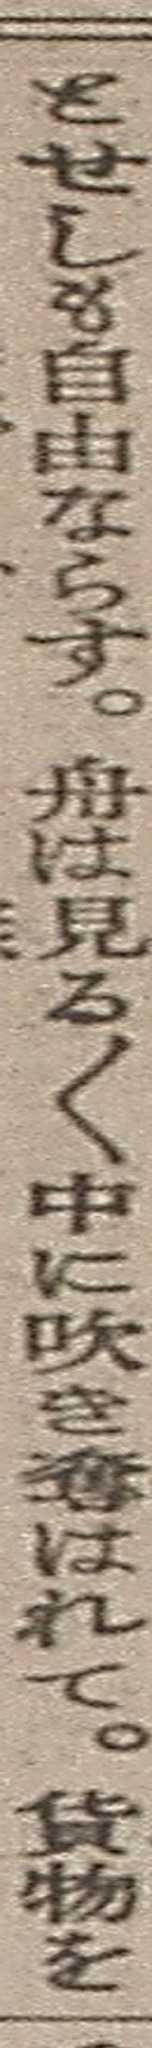とせしも自由ならす。舟は見る〳〵中に吹き奪はれて。貨物を
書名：風俗畫報臨時増刊第百九十九號　明治三十二年十月各地災害圖會（前編之續）
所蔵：東京大学地震研究所図書室 Earthquake Research Institute Library, The University of Tokyo, JAPAN
